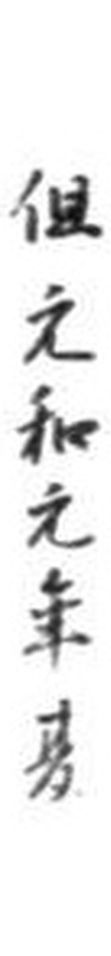但元和元年夏
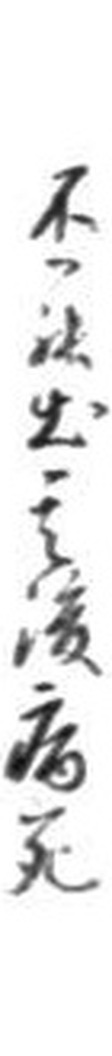不罷出其後病死
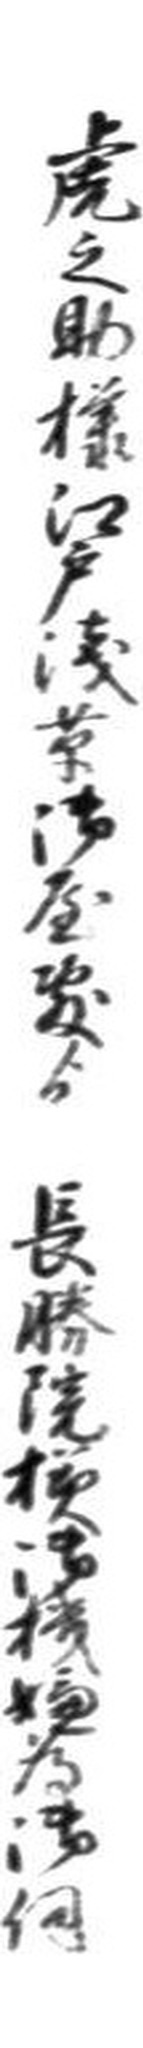虎之助様江戸浅草御屋敷ゟ長勝院様御機嫌為御伺
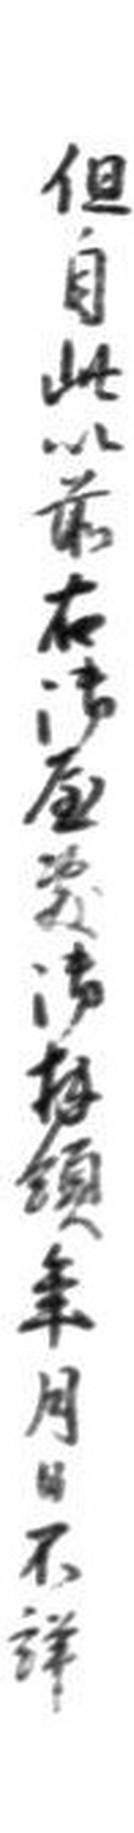但自此以前右御屋敷御拝領年月日不詳
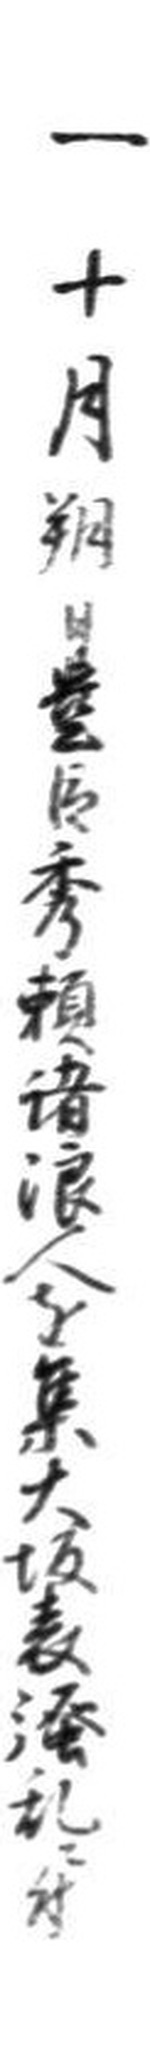一十月朔日豊臣秀頼諸浪人を集大坂表騒乱ニ付
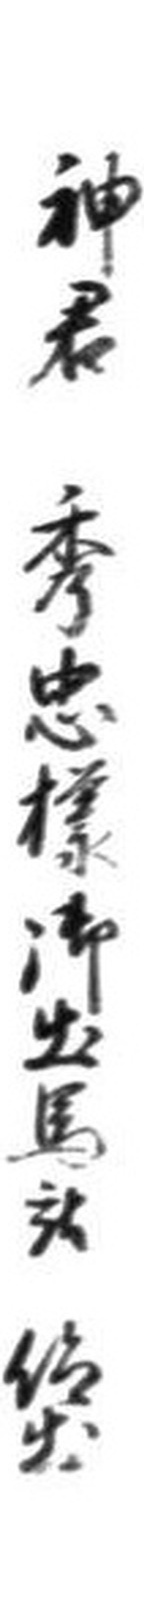神君秀忠様御出馬被仰出
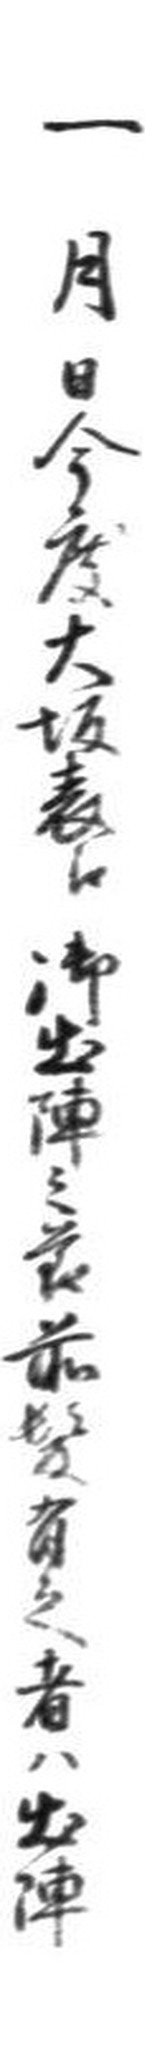一月日今度大坂表江御出陣之節前髪有之者ハ出陣
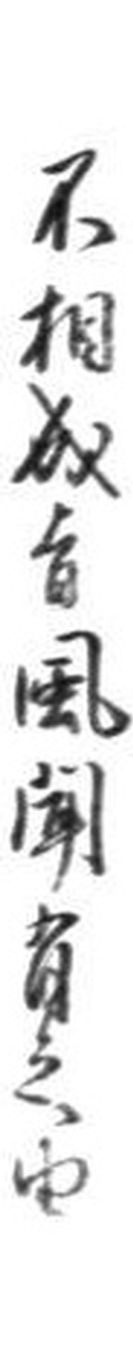不相成旨風聞有之由

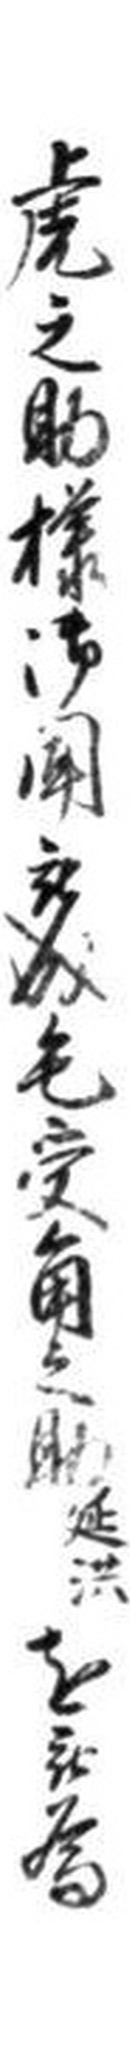虎之助様御聞被成毛受角之助延洪を被為
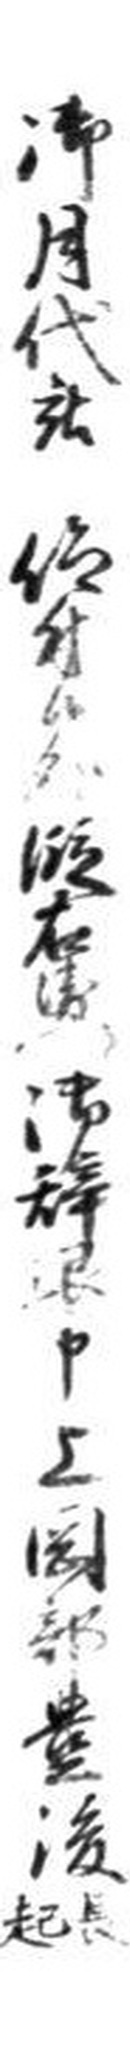御月代被仰付候処段右衛門御辞退申上岡部豊後長起
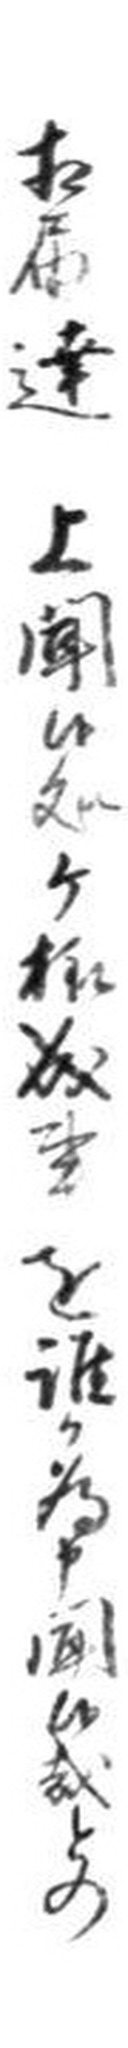相届達上聞候処ケ様成事を誰か為申聞候哉との
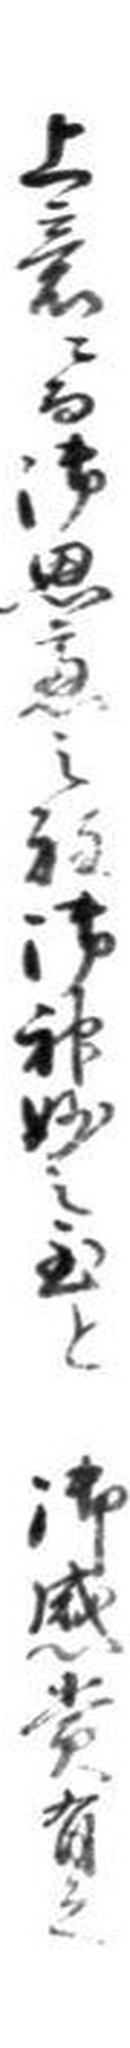上意ニ而御思慮之程御神妙之至と御感賞有之
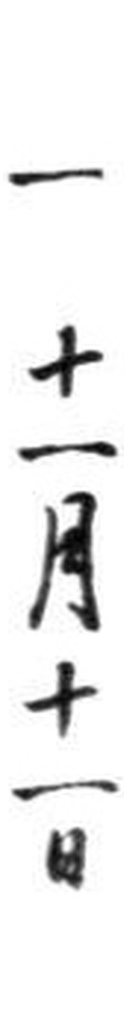一十一月十一日
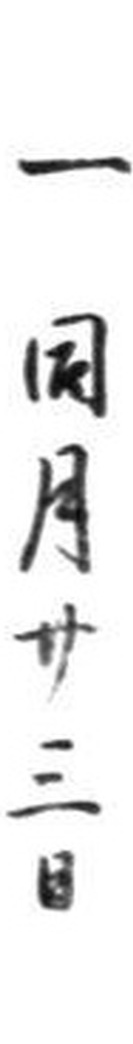一同月廿三日
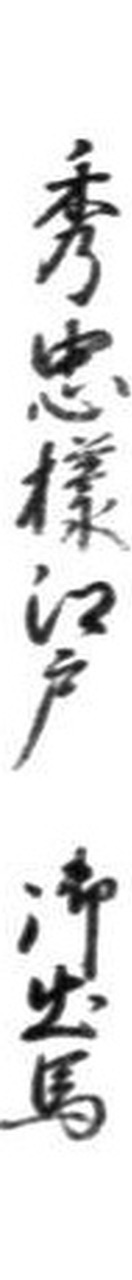秀忠様江戸御出馬
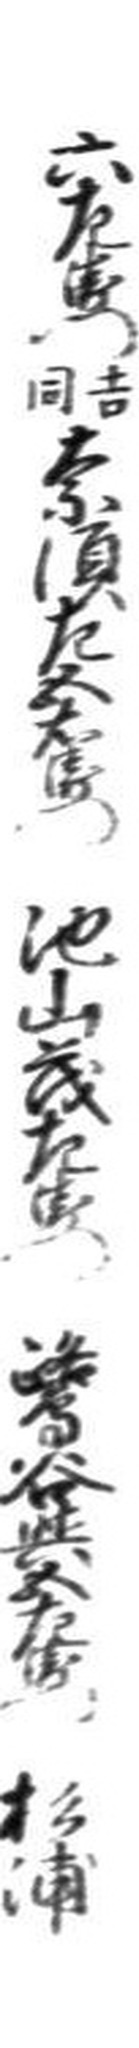六左衛門吉同奈須左五右衛門池山茂左衛門鷺谷與五左衛門松浦
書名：家譜 三 忠昌公 従慶長八年到寛永六年
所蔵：福井県文書館 Fukui Prefectural Archives
